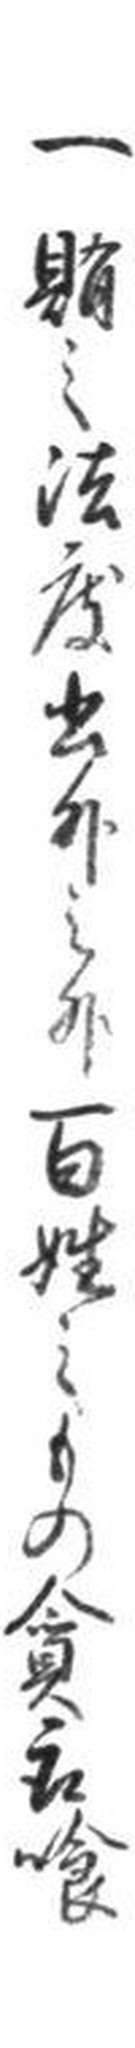一賄之法度書外之外百姓之もの貪取喰
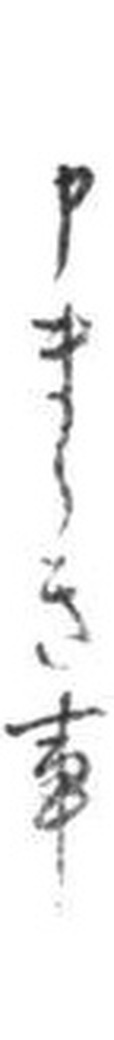申ましき事
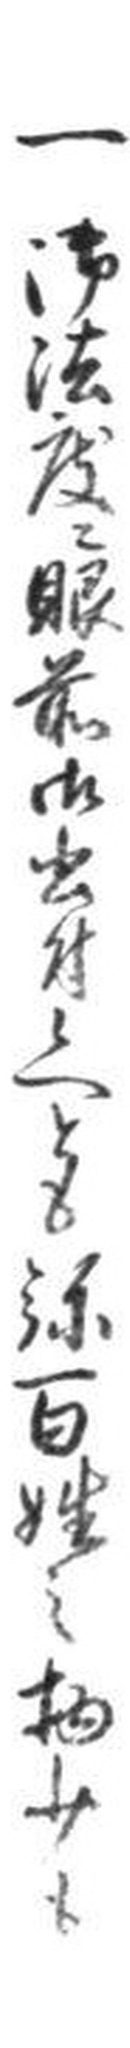一御法度ニ眼前御書付候へとも弥百姓之物少も
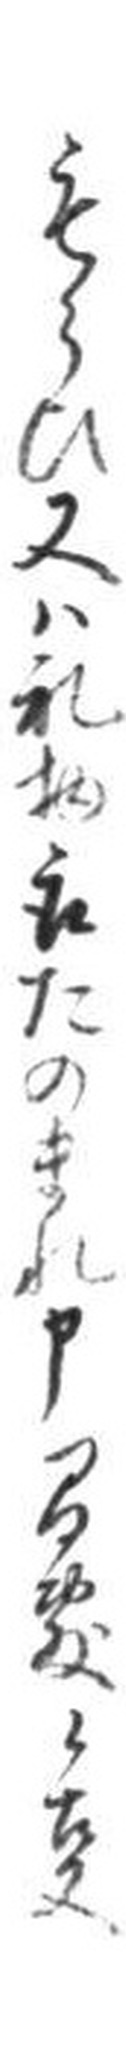もらひ又は礼物取たのまれ申間敷候事
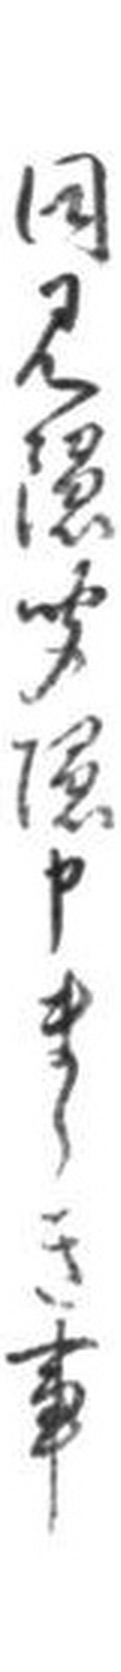同見隠聞隠申ましき事
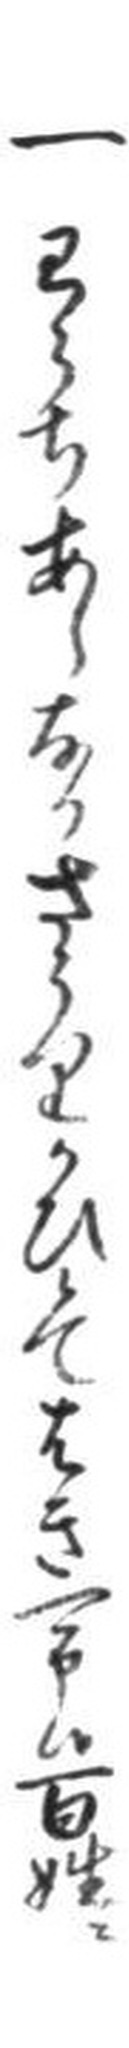一わらちあしなかさうりかひ候てはき可申候百姓ニ
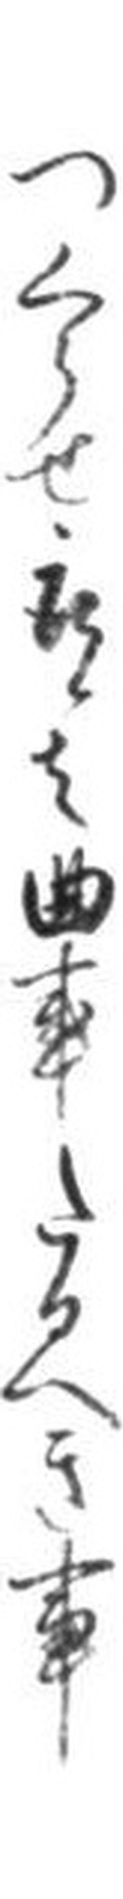つくらせ取候は曲事たるへき事
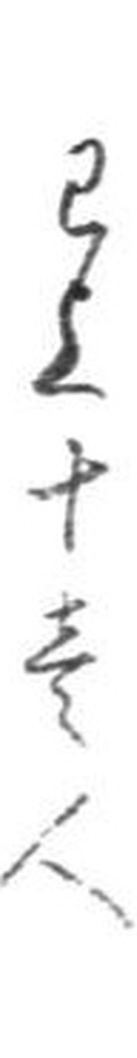已上十壱人

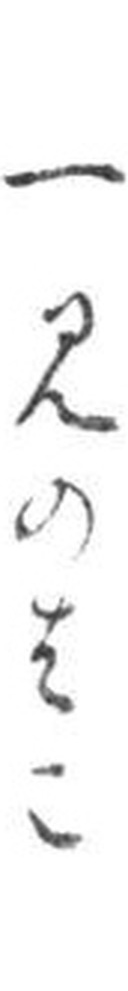一みのはこ
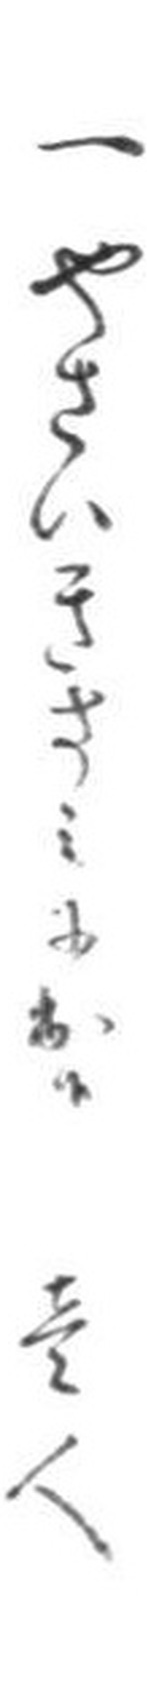一やさいきさみに出候壱人
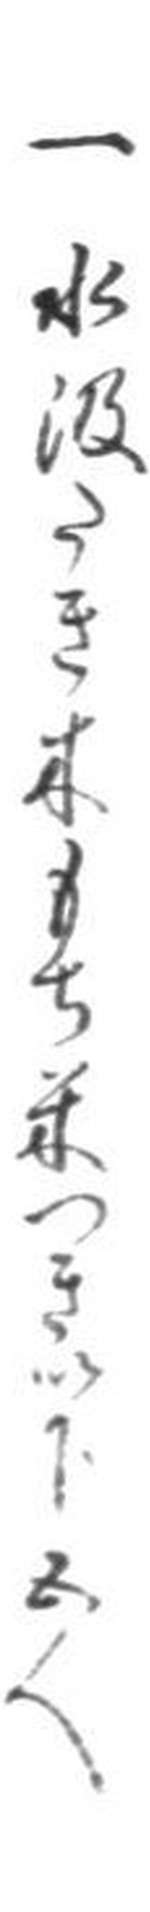一水汲たき木もち米つき以下五人
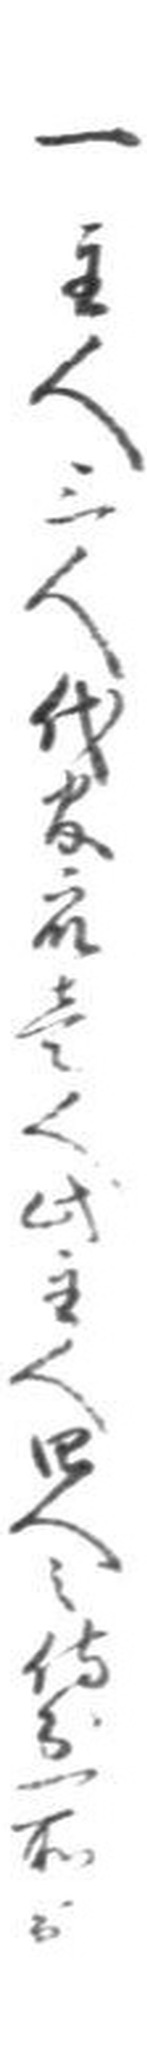一主人三人代官衆壱人此主人四人之侍分一所ニ而

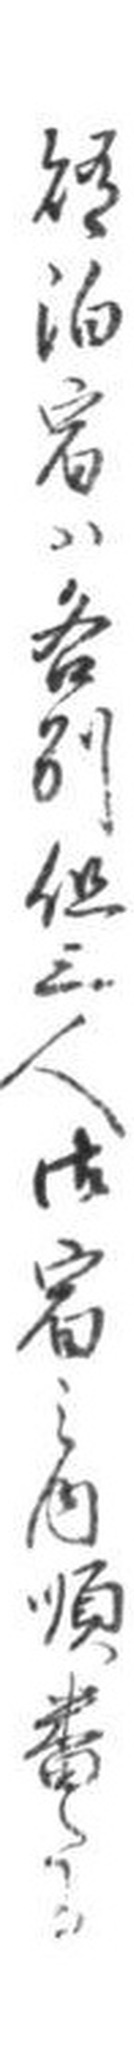賄泊宿は各別但三人御宿之内順番たる
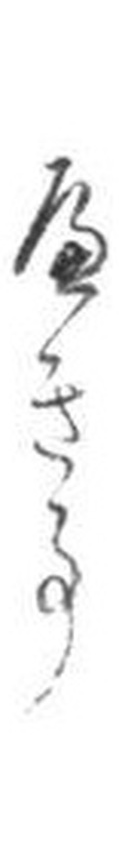へき事
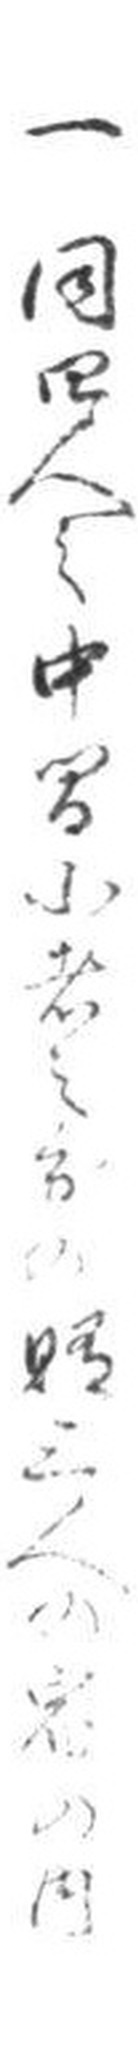一同四人之中間小者之分の賄三人の宿の内
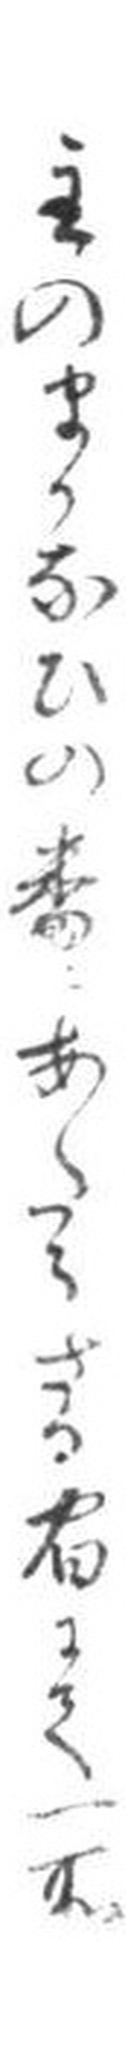主のまかなひの番ニあたらさる宿にて一所
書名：家譜 三 忠昌公 従慶長八年到寛永六年
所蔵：福井県文書館 Fukui Prefectural Archives
